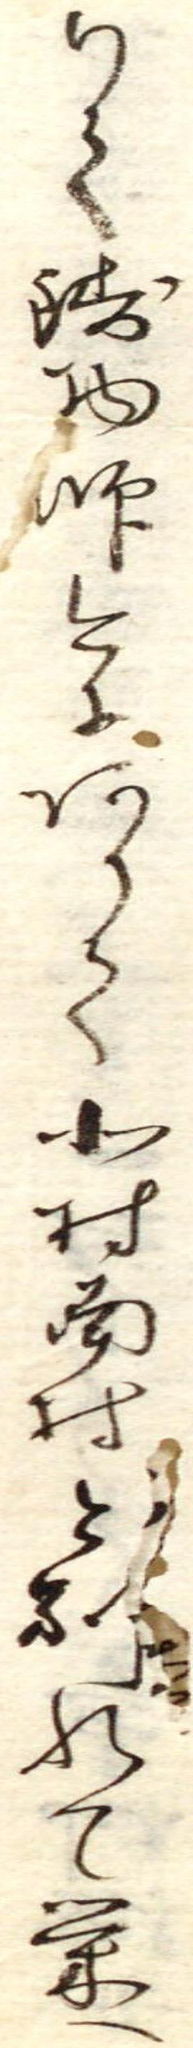りて鋳物師今にありて北村南村と別れて栄へ
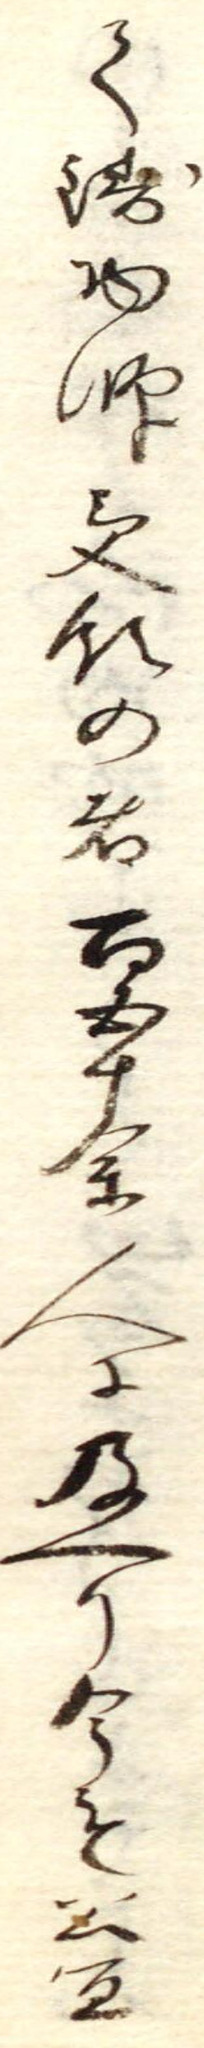て鋳物師受領の者百五十余人に及へり今も公宜
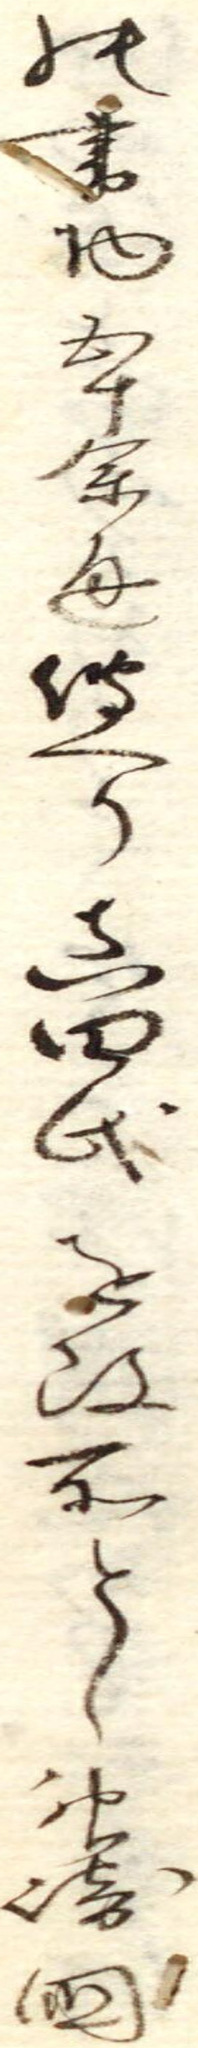の書物五十余通伝へり真田氏を改所とし神崎国
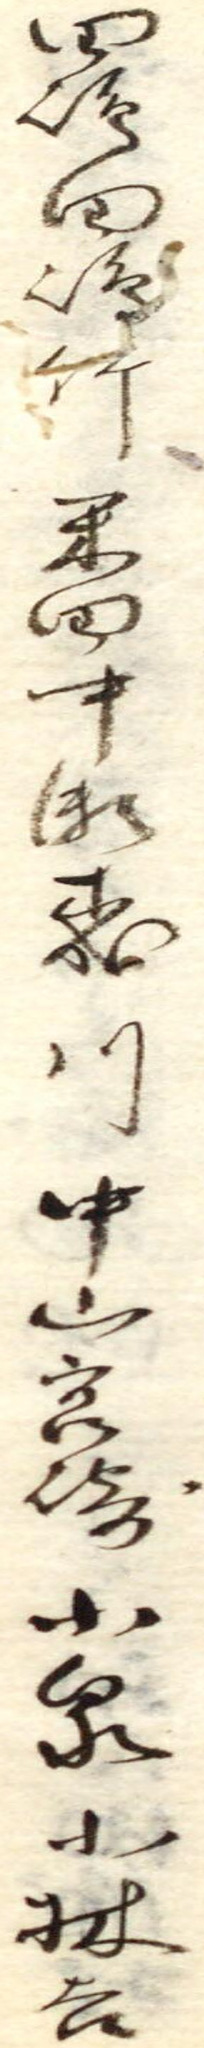田嶋田嶋竹米田中瀬森川中山宮崎小泉小林吉
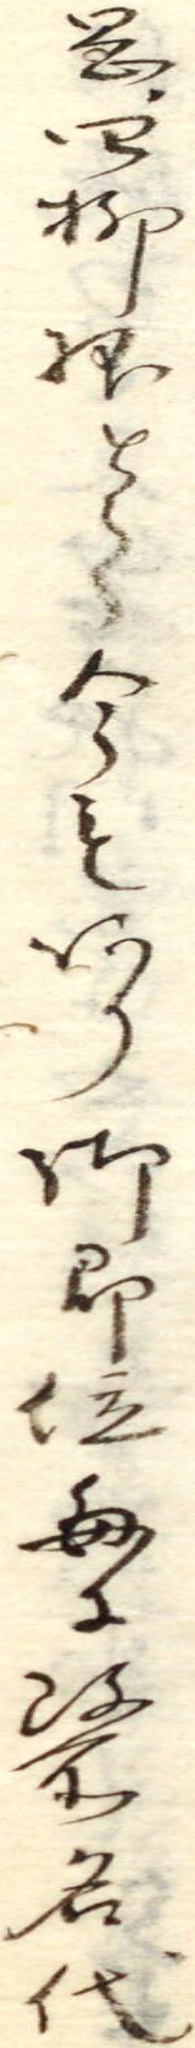岡四柳抔とて今もあり御即位毎に改所名代
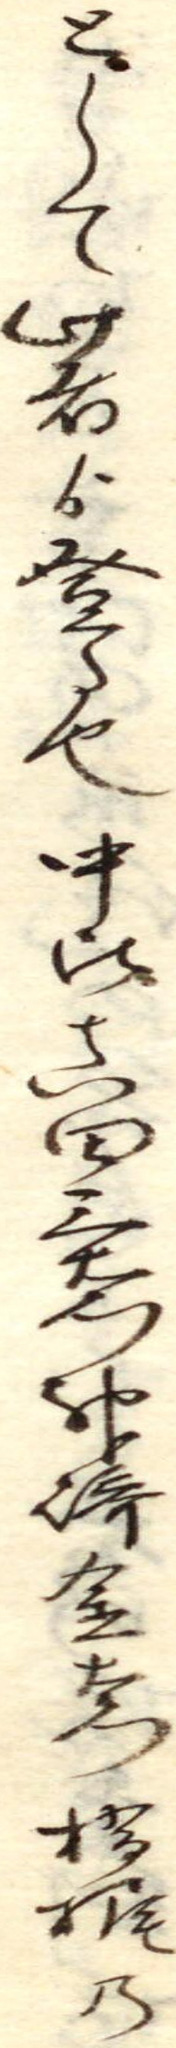として此者ゟ登る也中比真田三右衛門神崎金右衛門橋梶の
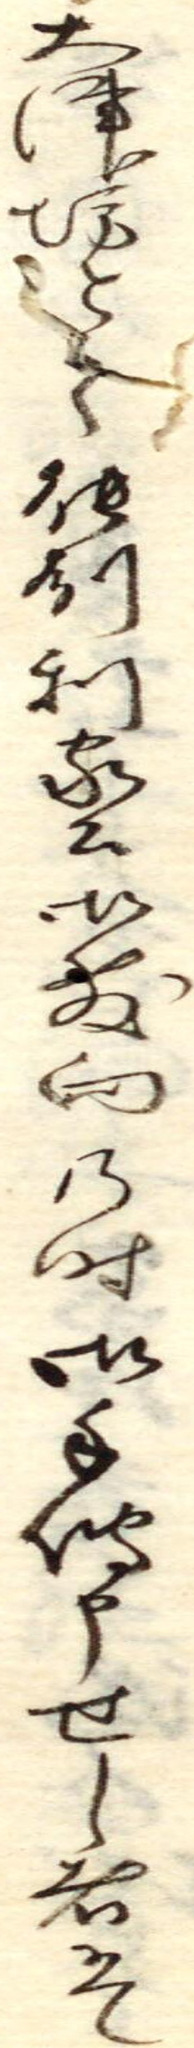大津坊とて能州利家公御発向の時御手伝申せし者にて
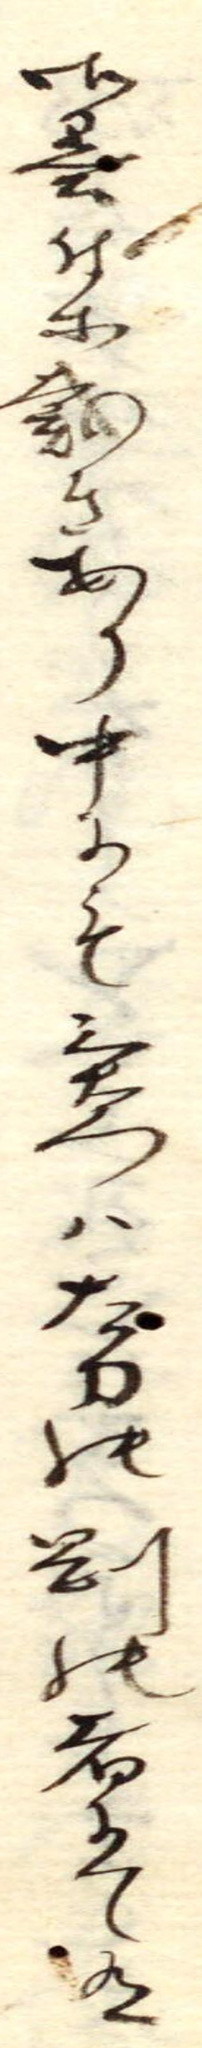御墨付等戴きあり中にも三右衛門は太刀の剛の者にて有
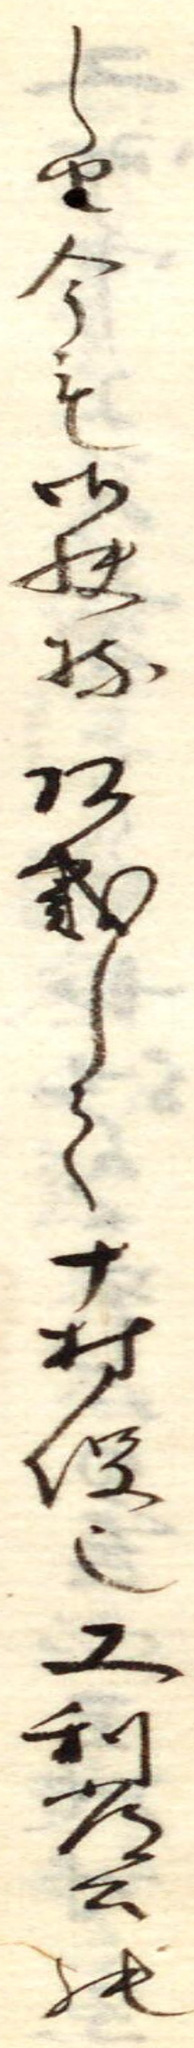し由今も御扶持頂戴して十村役也又利常公の
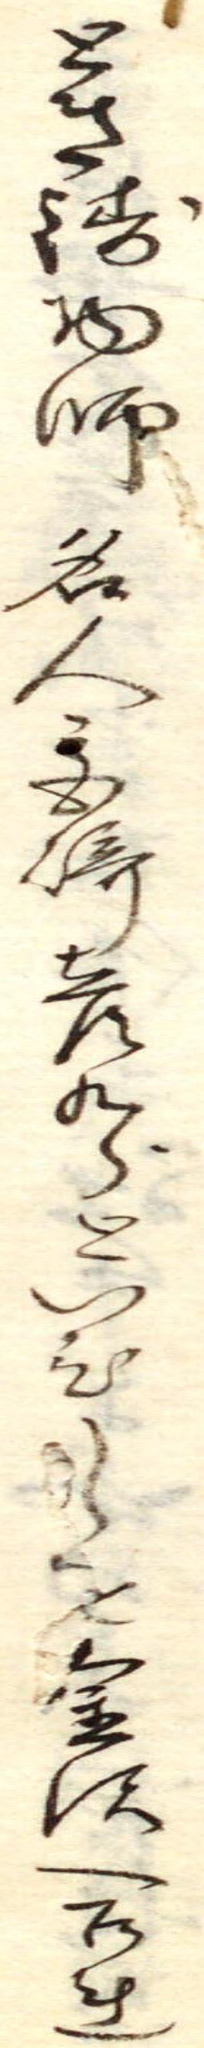とき鋳物師名人宮崎彦九郎といひしを金沢へ召連
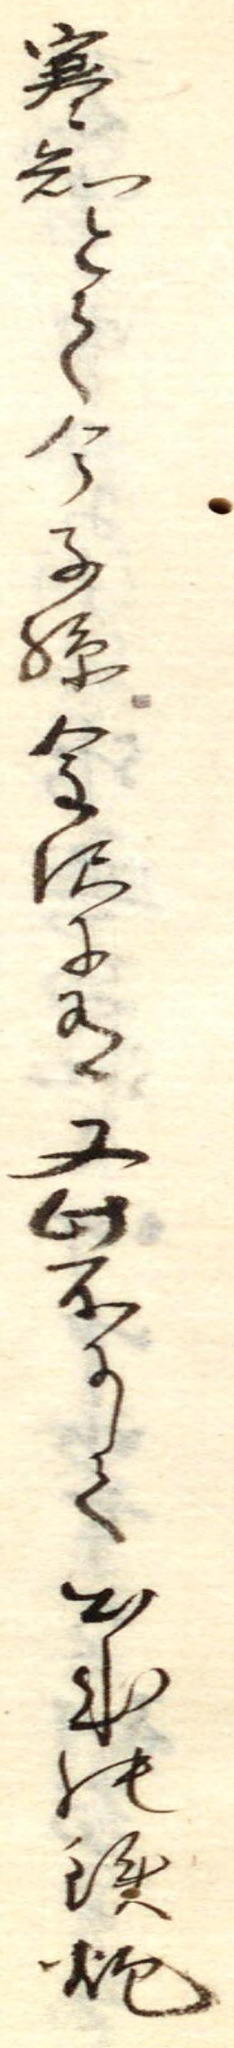寒知とて今子孫金沢に有又此所にて出水の鉄炮
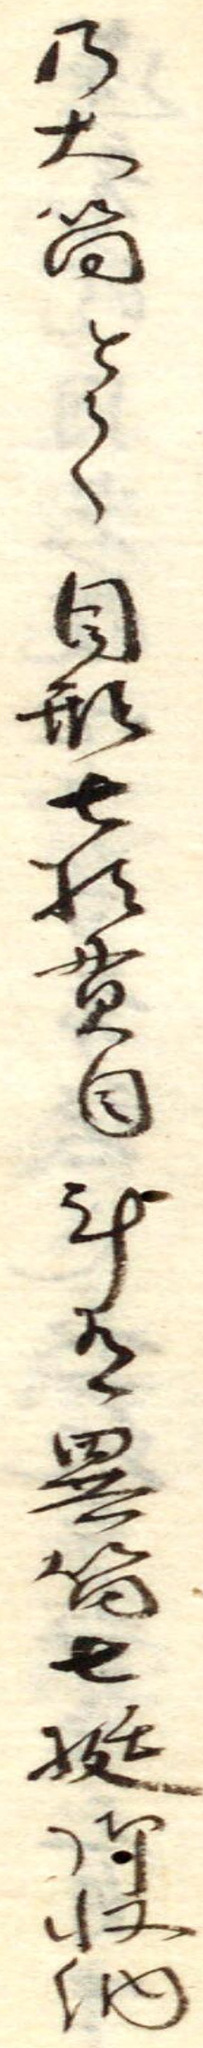の大筒とて目形七拾貫目計有異筒七挺御収納
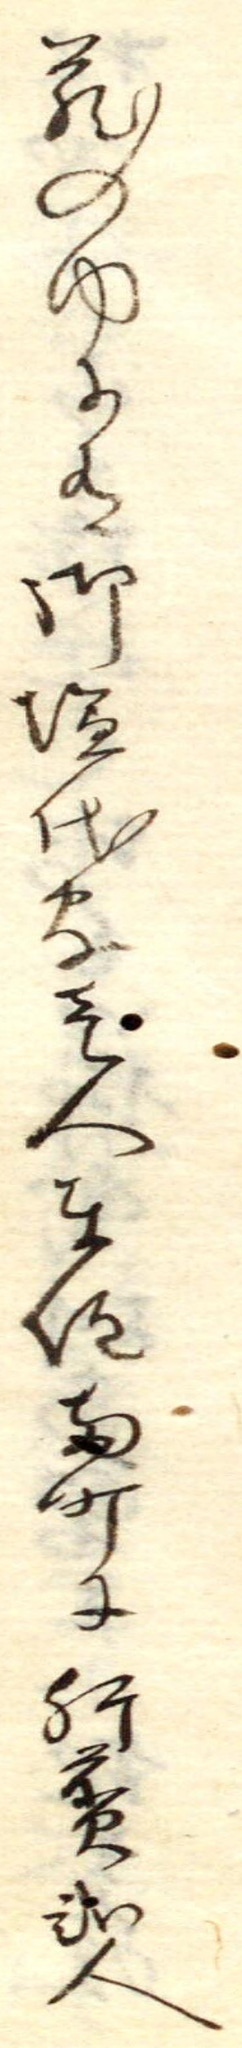蔵の内に有御塩代官壱人在住両町に肝煎弐人
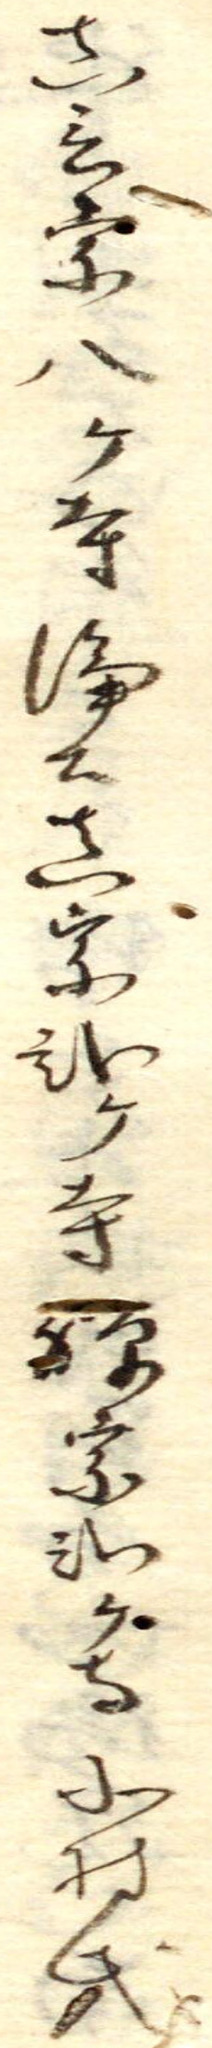真言宗八ヶ寺浄土真宗弐ヶ寺禅宗弐ヶ寺北村氏

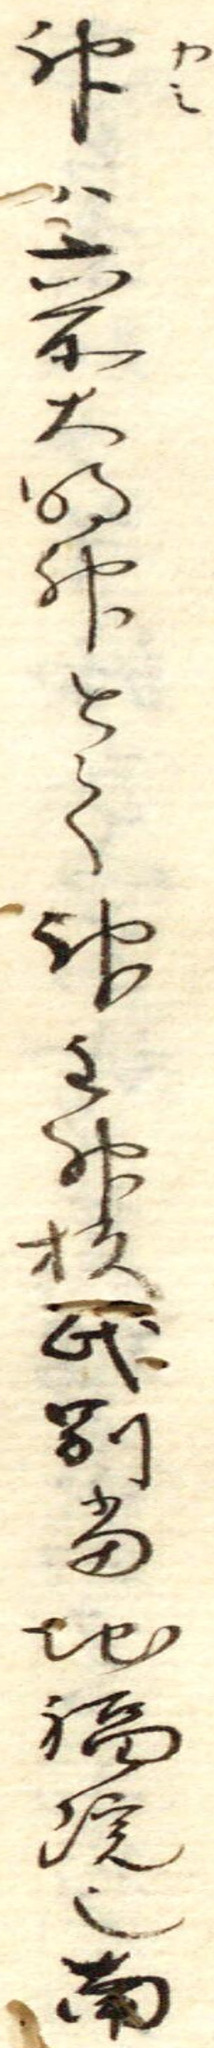神は六所大明神とて神主神杉氏別当地福院也南
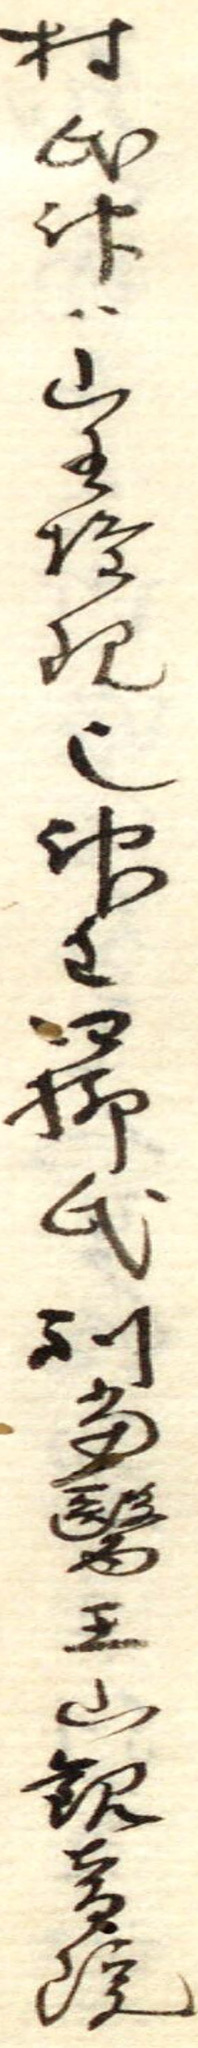村氏神は山王権現也神主四柳氏別当医王山観音院
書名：能登名跡誌
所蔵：Ishikawa Prefectural Library
